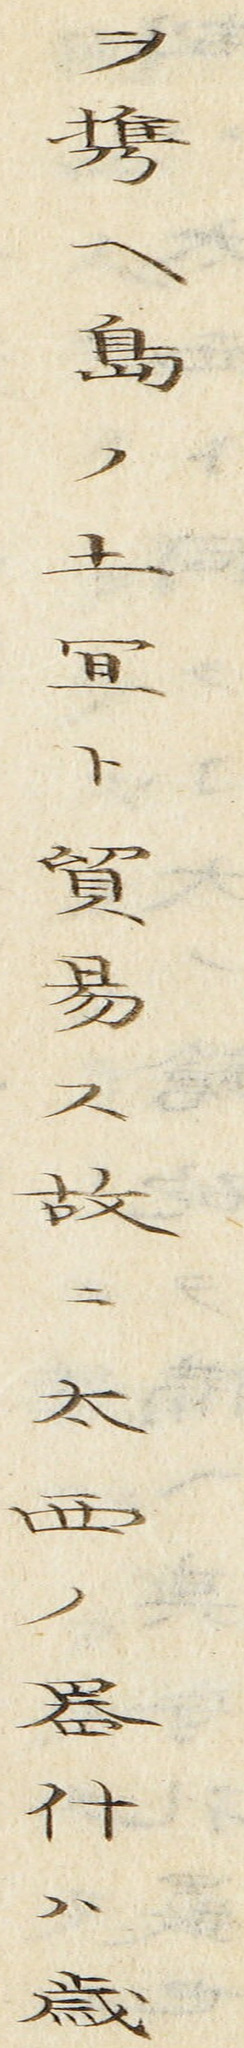ヲ携ヘ島ノ土宜？ト貿易ス故ニ太西ノ器什ハ歳
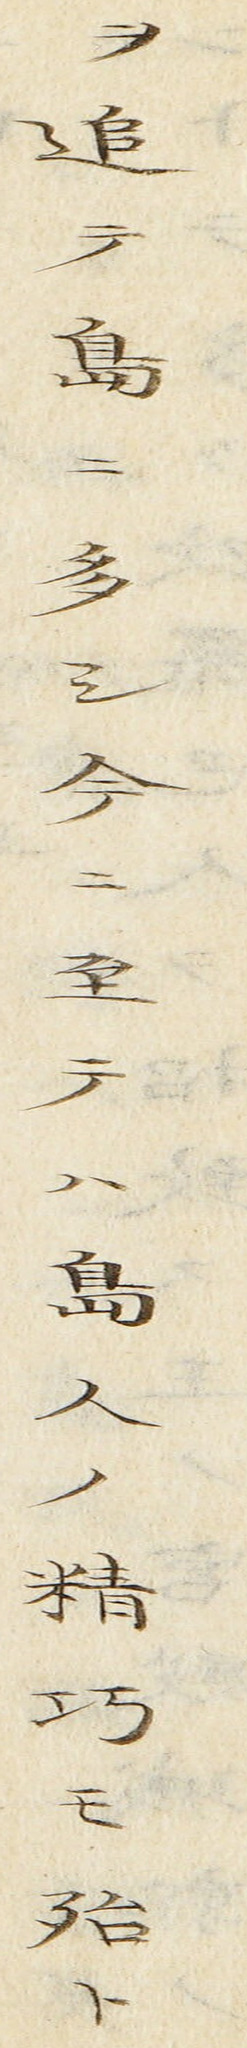ヲ追テ島ニ多シ今ニ至テハ島人ノ精巧モ殆ト
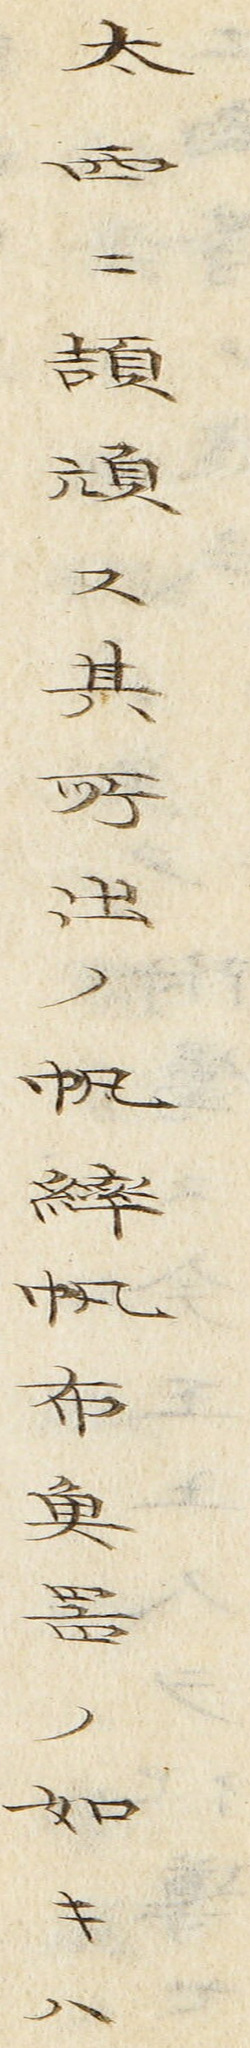太西ニ頡頑ス其所出ノ帆繂帆布魚器ノ如キハ
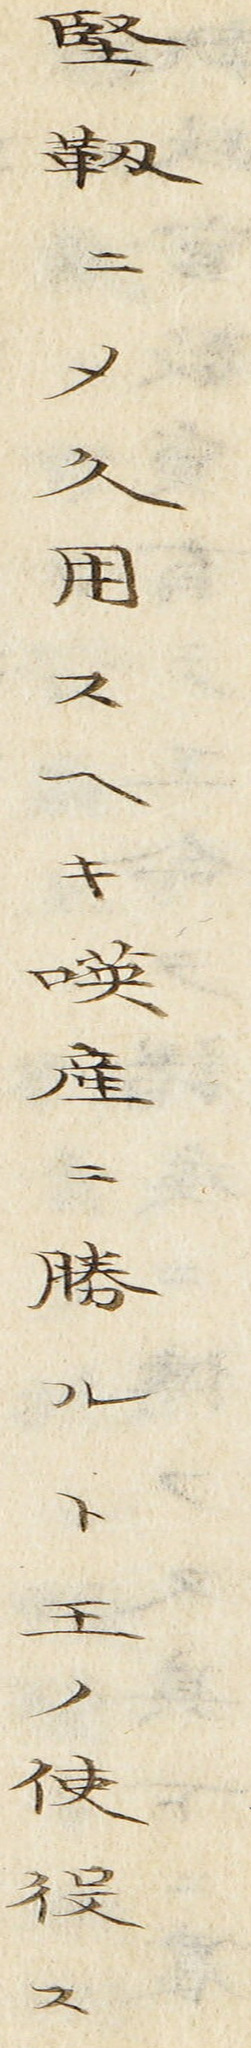堅靭ニシテ久用スヘキ産ニ勝ルト王ノ使役ス
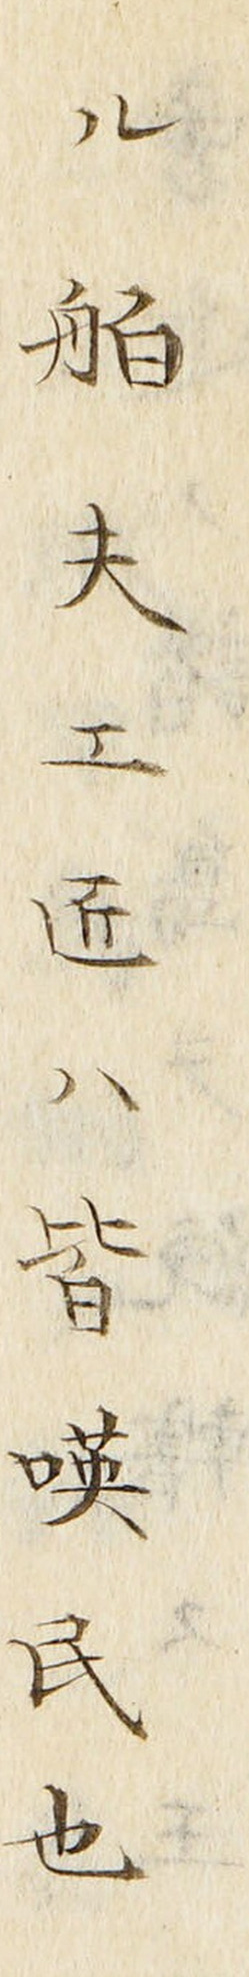ル舶夫工匠ハ皆民也
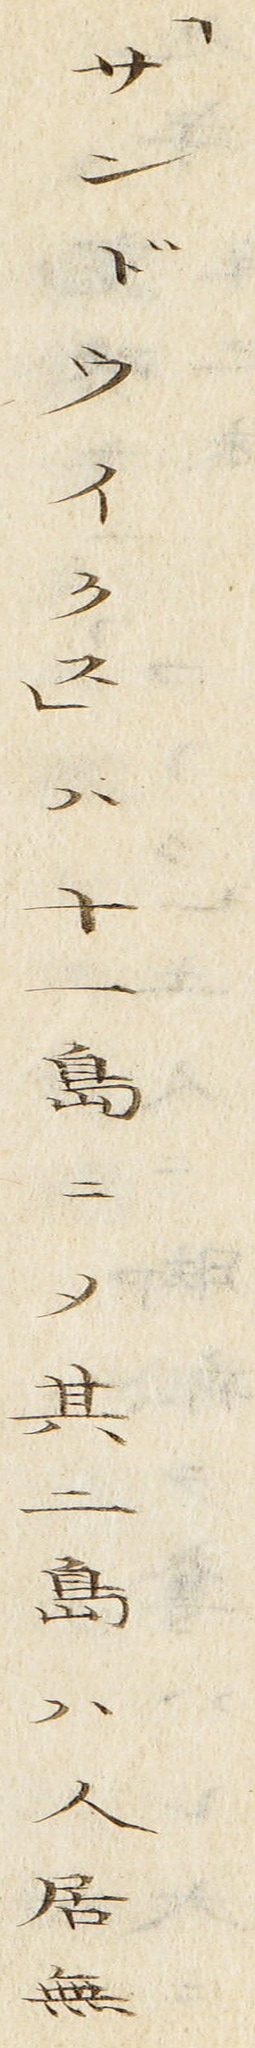「サンドウイクス」ハ十一島ニシテ其二島ハ人居無
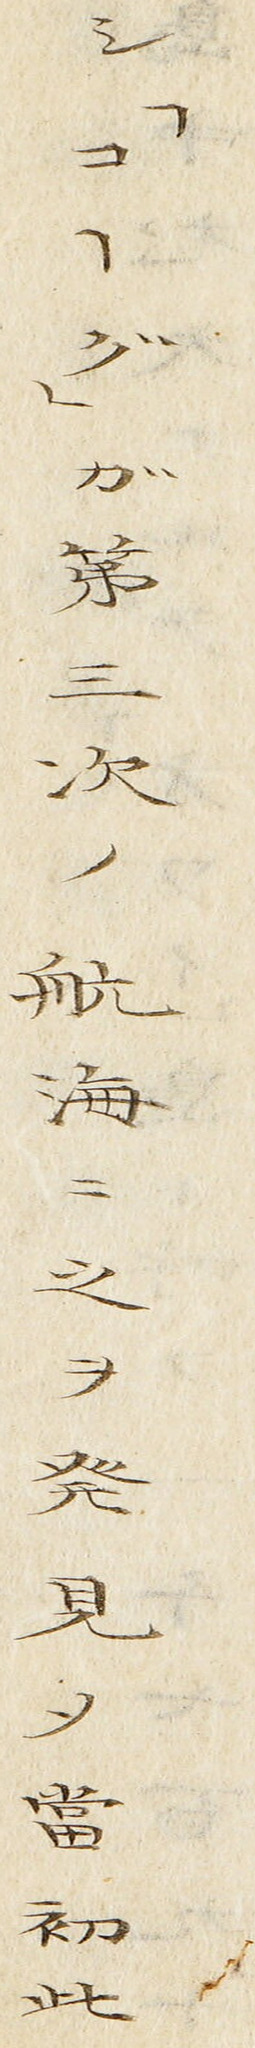シ「コーグ」ガ第三次ノ航海ニ之ヲ発見シテ當初此
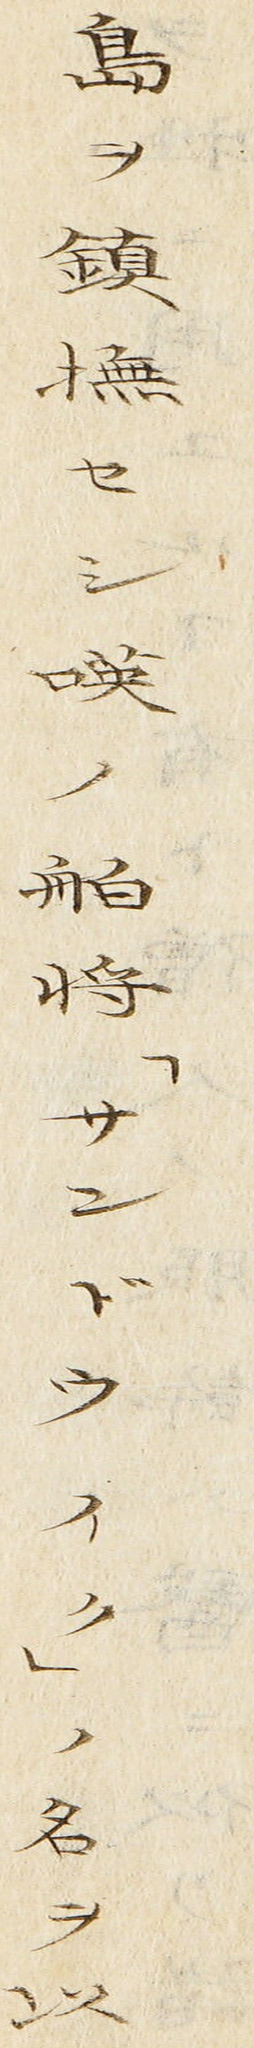島ヲ鎮撫セシノ舶将「サンドウイク」ノ名ヲ以
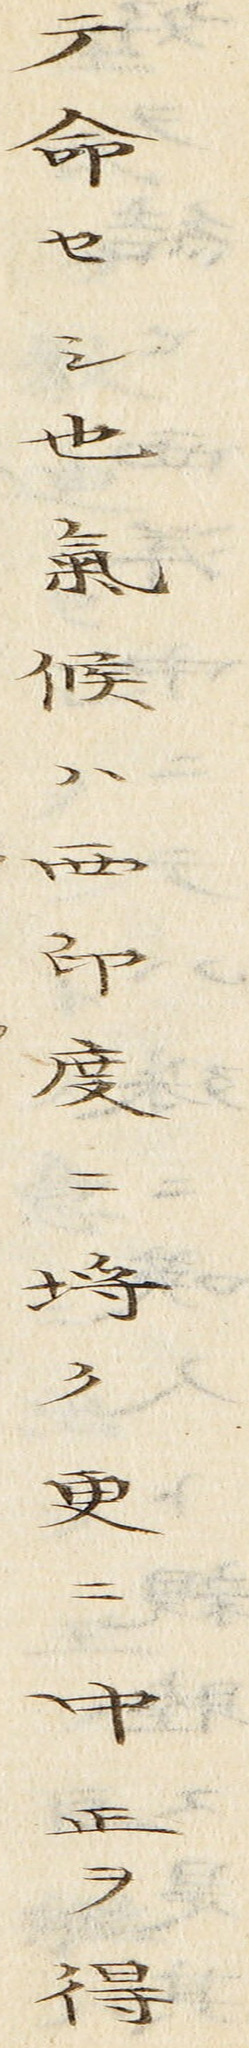テ命セシ也氣ハ西印度ニ埒？ク更ニ中正ヲ得
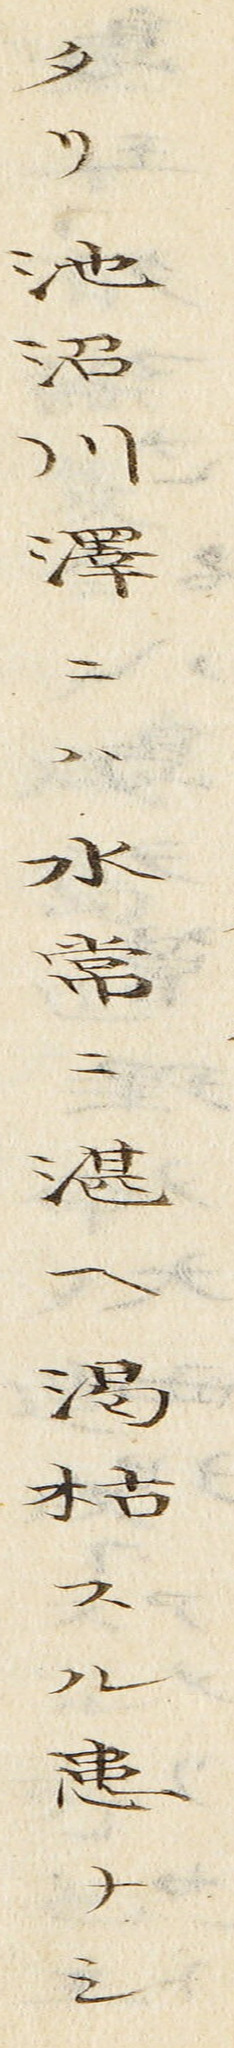タリ池沼川澤ニハ水常ニ湛ヘ渇枯スル患ナシ
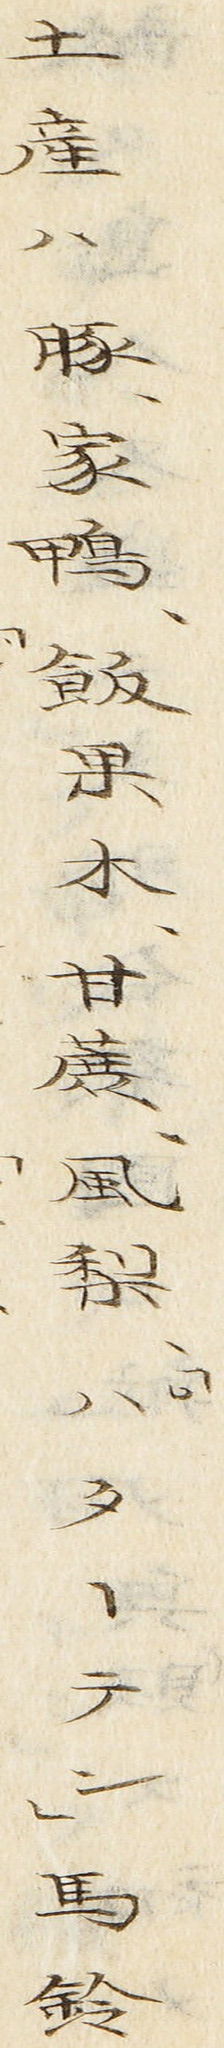土産ハ豚、家鴨、飯果木、甘蔗、風梨、「パターテン」馬鈴
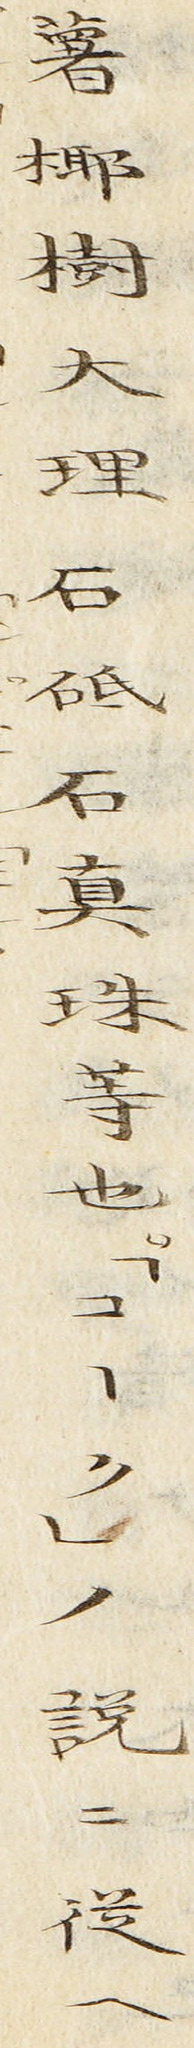※薯椰樹大理石砥石真珠等也。「コーク」ノ説ニ従ヘ
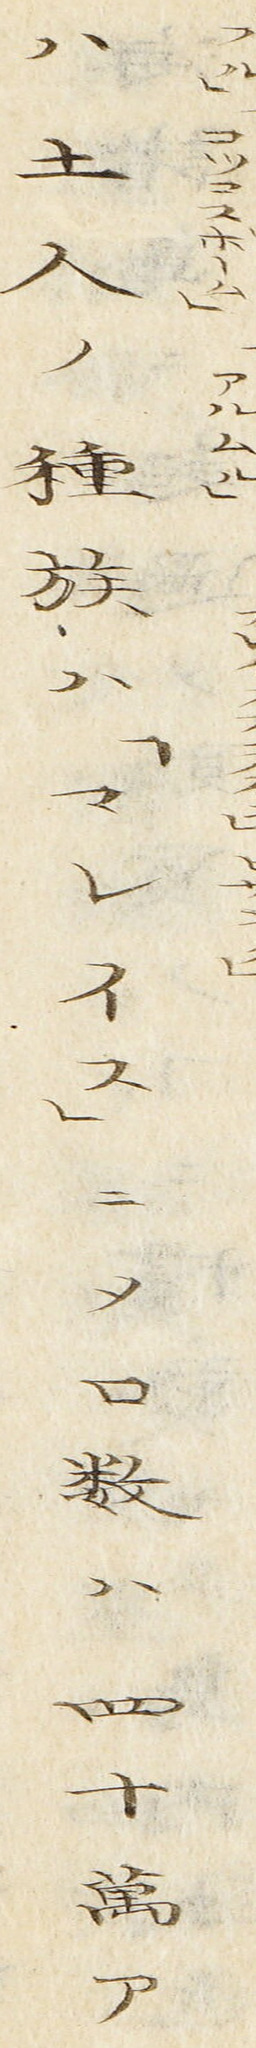ハ土人ノ種族ハ「マレイス」ニシテロ数ハ四十萬ア
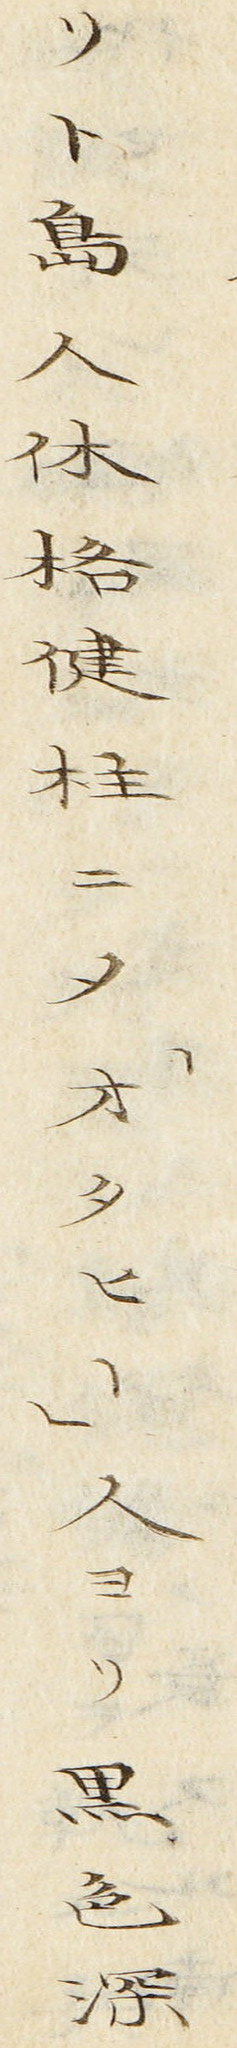リト島人休格健柱ニシテ「オタヒー」人ヨリ黒色深
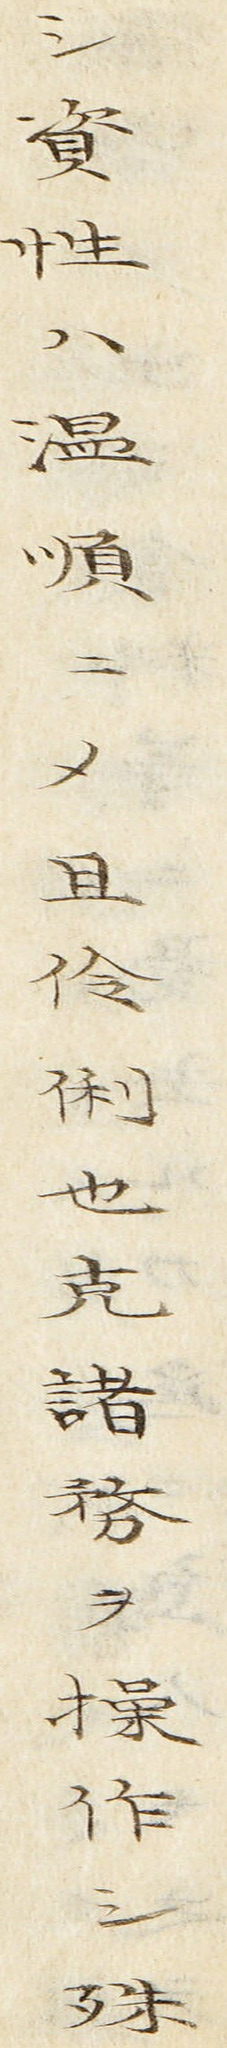シ資性ハ温順ニシテ且怜悧也克諸務ヲ操作シ殊
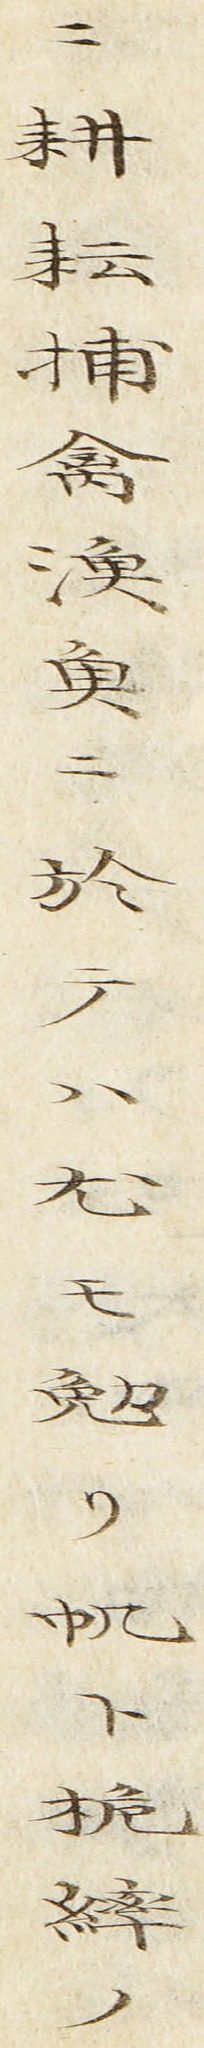ニ耕耘捕禽漁魚ニ於テハ尤モ勉リ帆ト桅繂ノ
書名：蕃談
